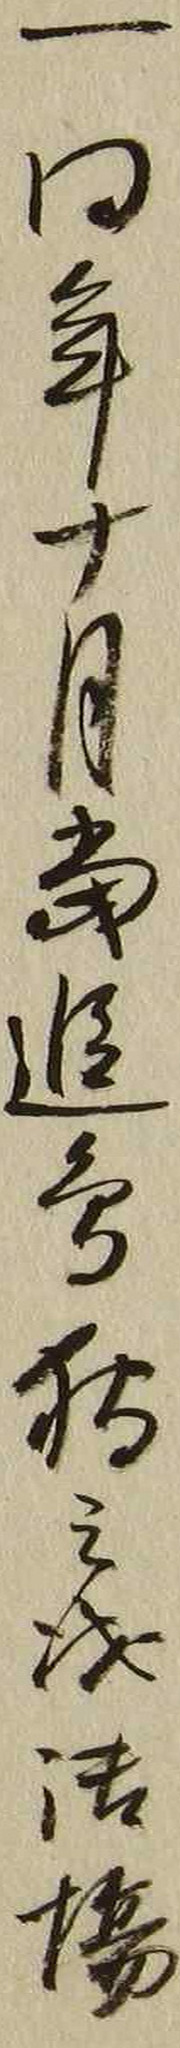一同年十月当追鳥狩之儀御場
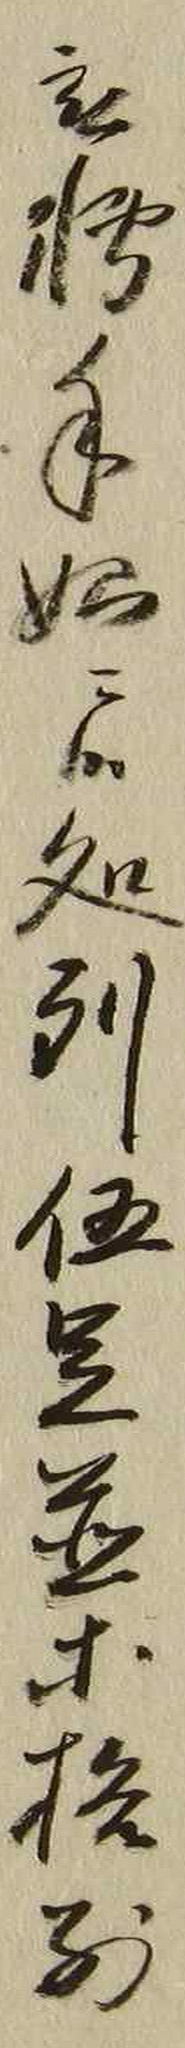被転手始ニ候処列伍足並等格別
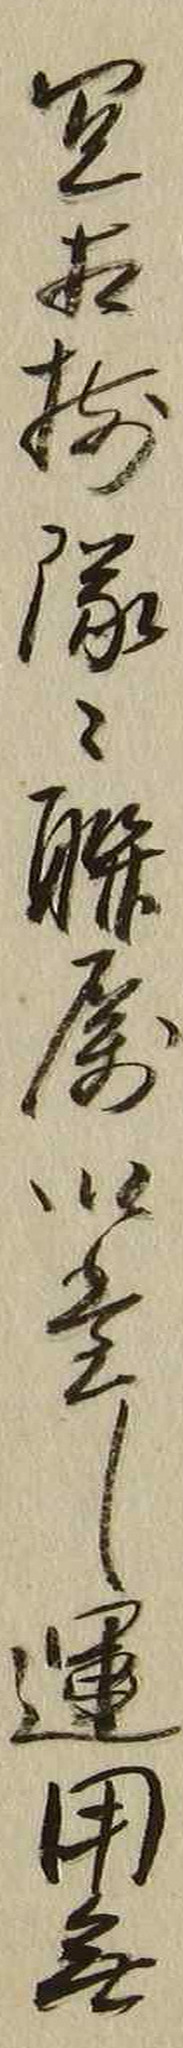宜相揃隊々聯属いたし運用無
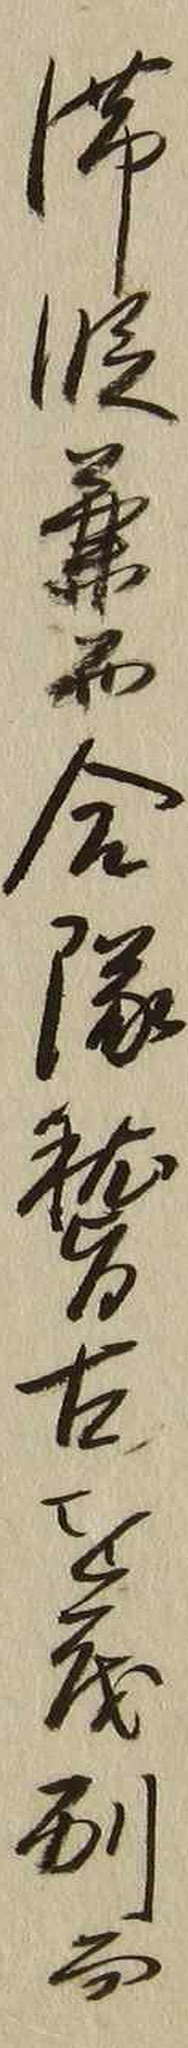滞段兼而合隊稽古をも別而
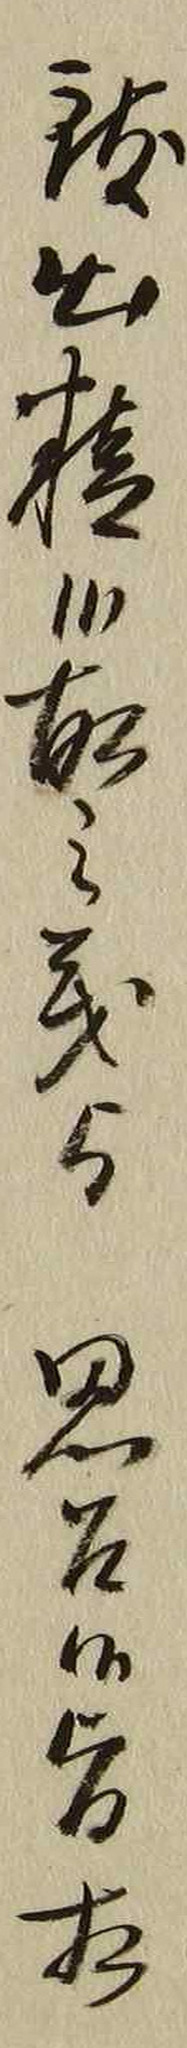致出精候故之義被思召候旨相
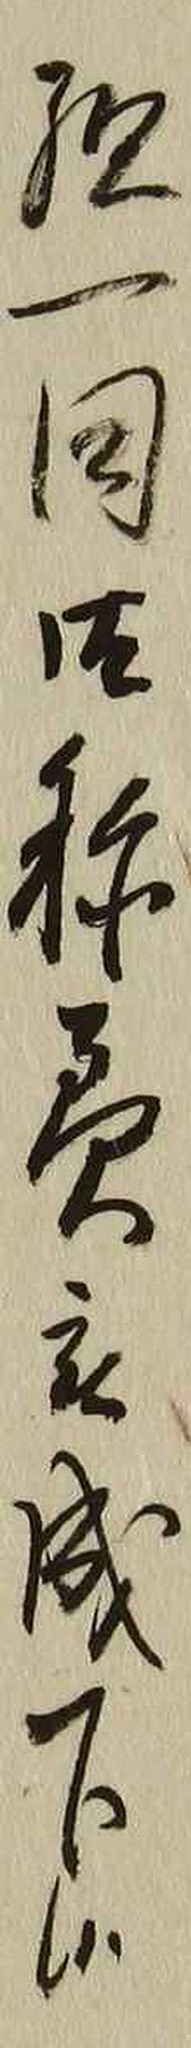組一同御称美被成下候
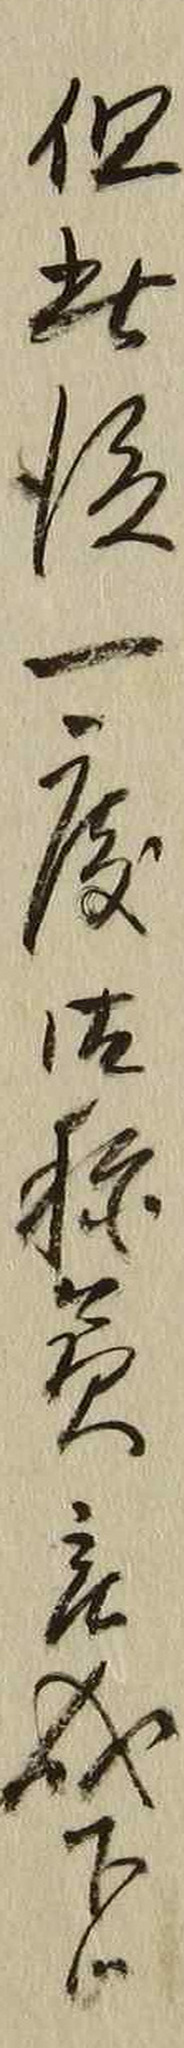但此後一度御称美被成下
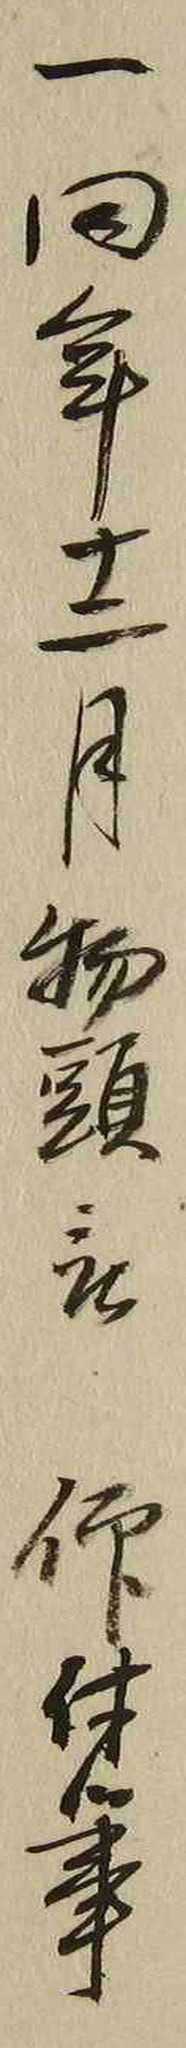一同年十二月物頭被仰付候事
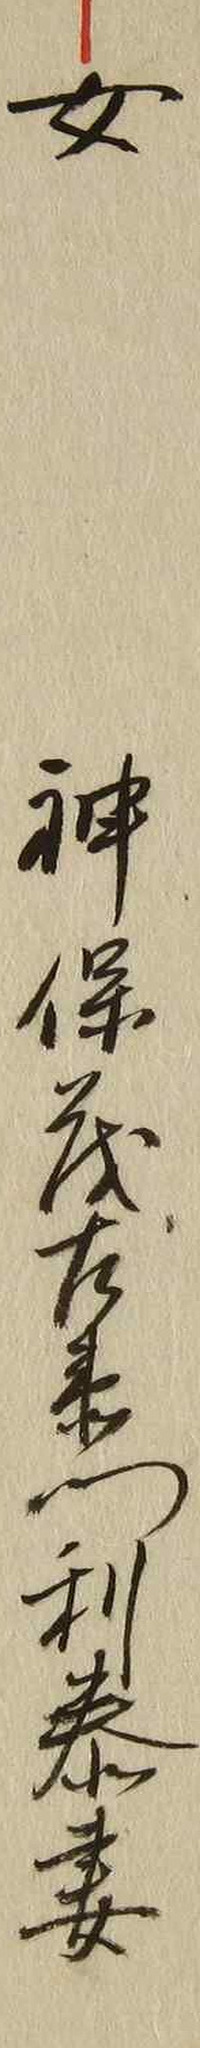女神保茂左衛門利泰妻
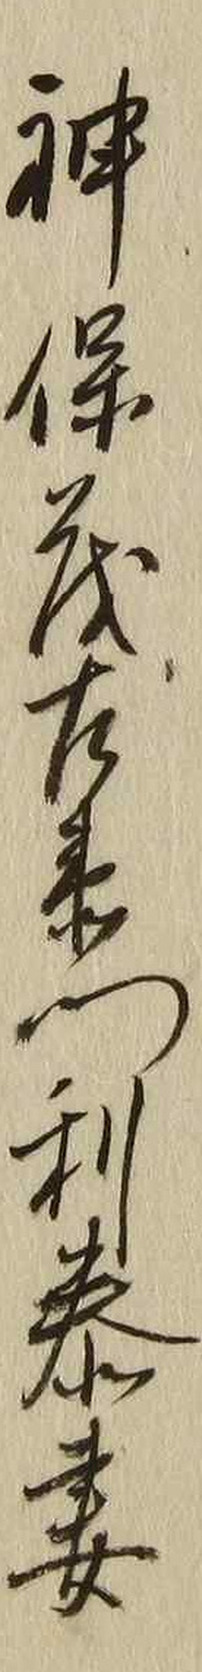女神保茂左衛門利泰妻
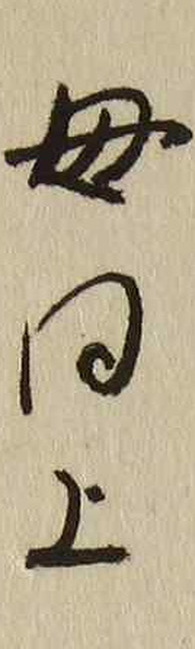母同上
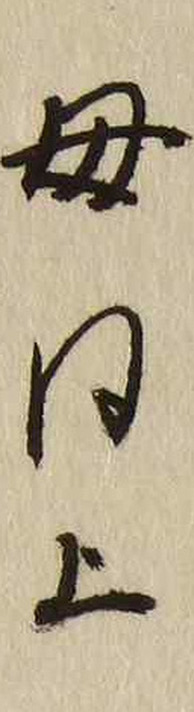母同上

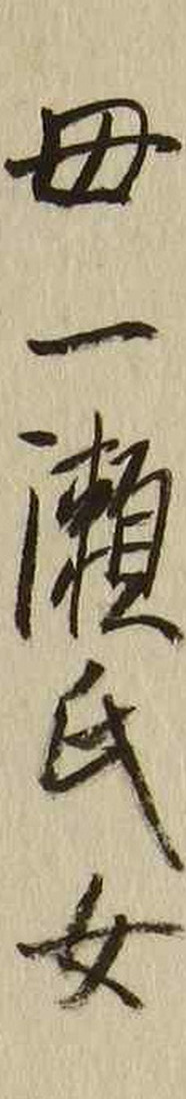母一瀬氏女
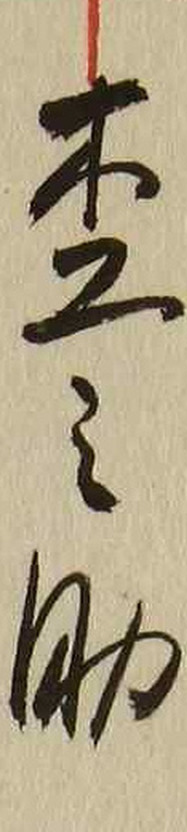杢之助
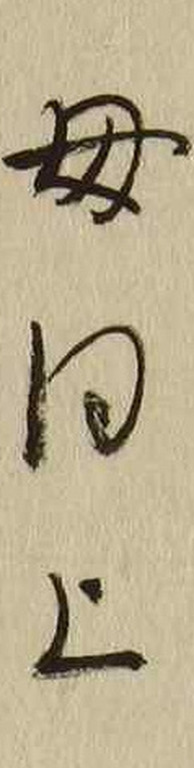母同上
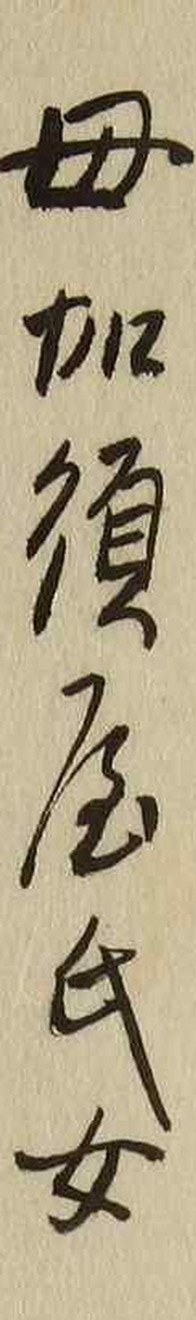母加須屋氏女
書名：諸士系譜　巻之356　す之部6
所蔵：会津若松市立会津図書館
